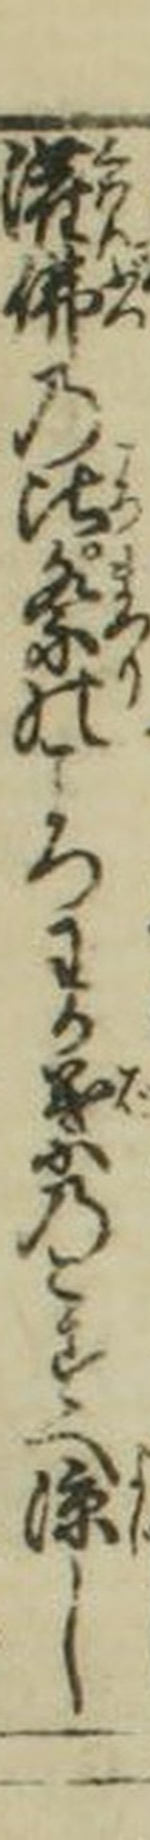灌仏の比。祭のころわか葉のこすへ涼し
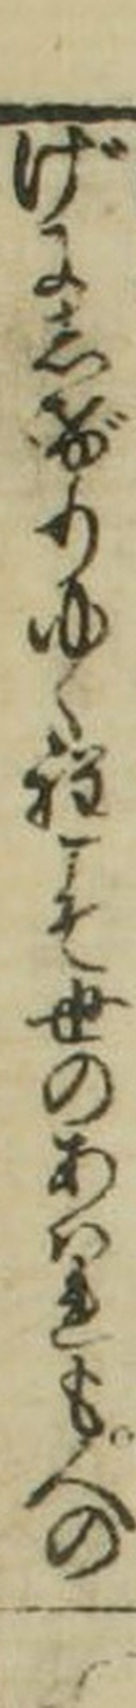げにしげりゆく程こそ世のあはれも。人の
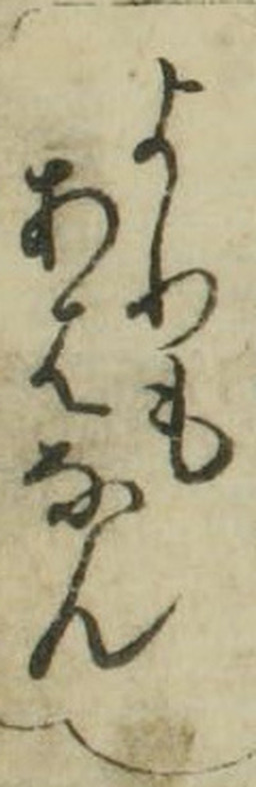あはなん

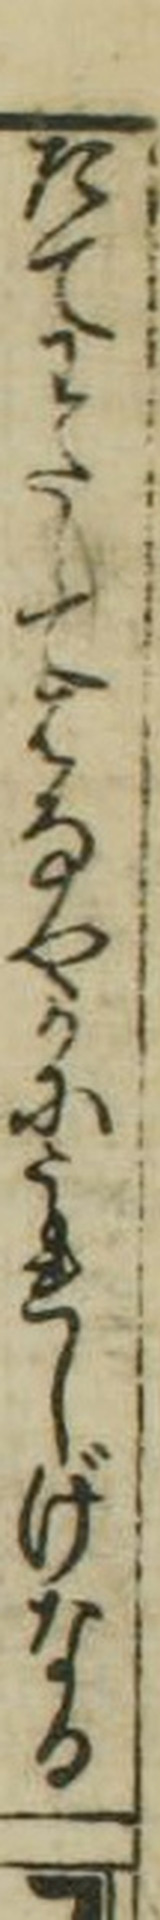たてわたしてはなやかにうれしげなる
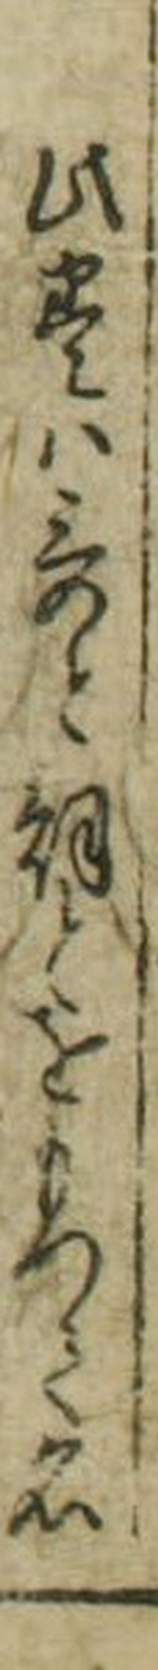此巻は哥と詞とをもつて名
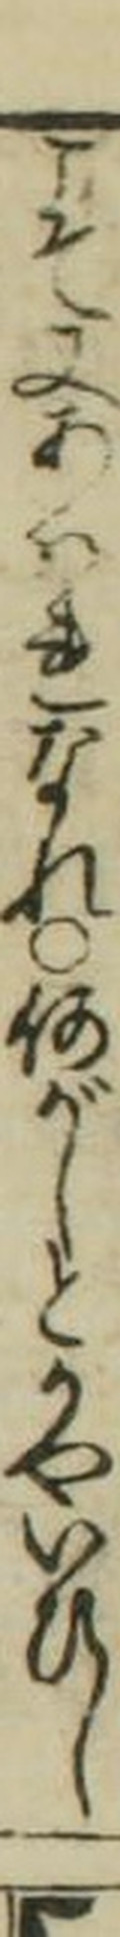こそ又あはれなれ◯何がしとかやいひし
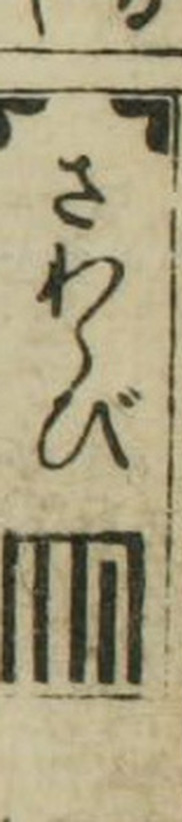さわらび
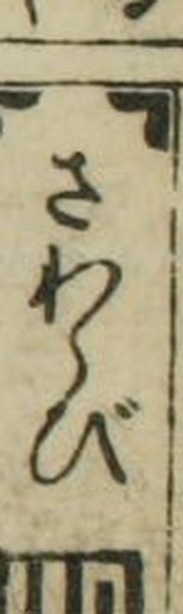さわらび
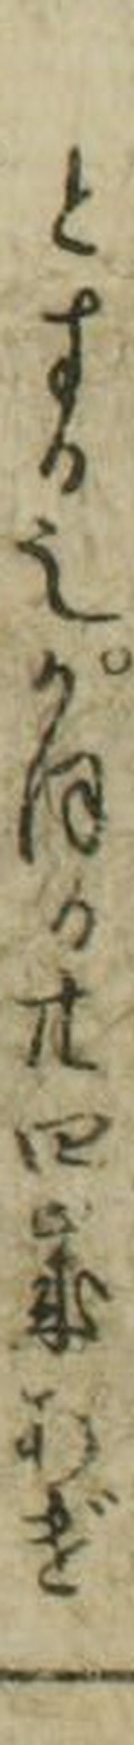とする也。かほる廿四歳あげ
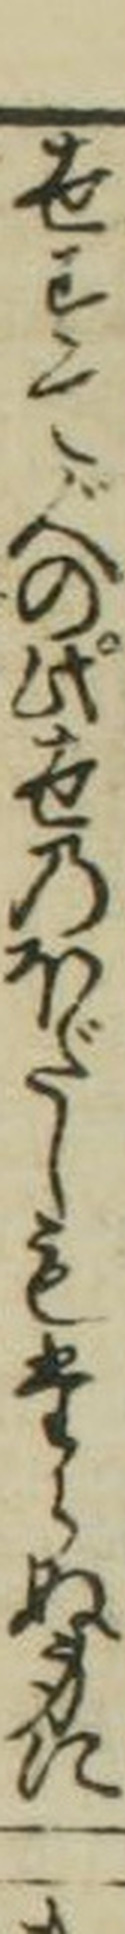世すて”人の。此世のほだしもたらぬ身に
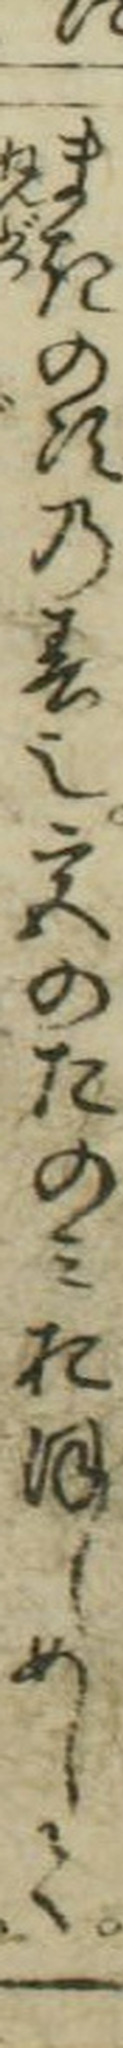まきの次の巻也。宮のたのみおほしめして。
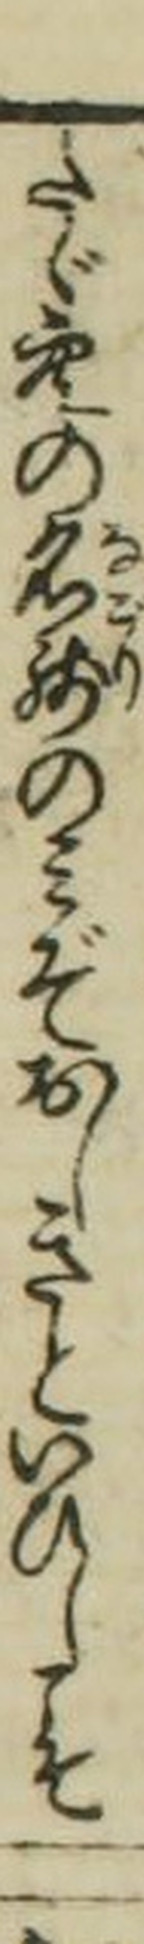たゞ空の名残のみぞおしきといひしこそ
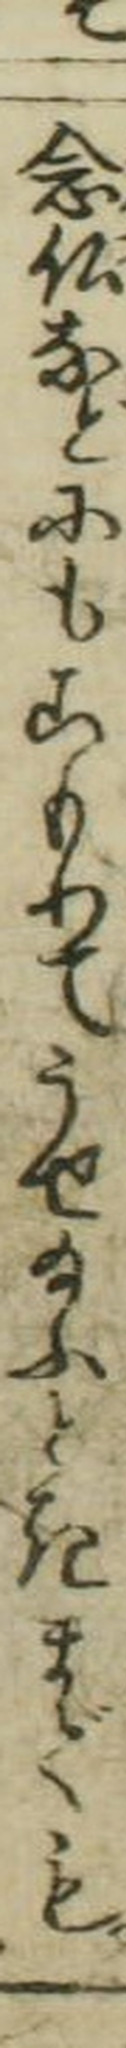念仏などにもこもりてうせ給ふときまでも。
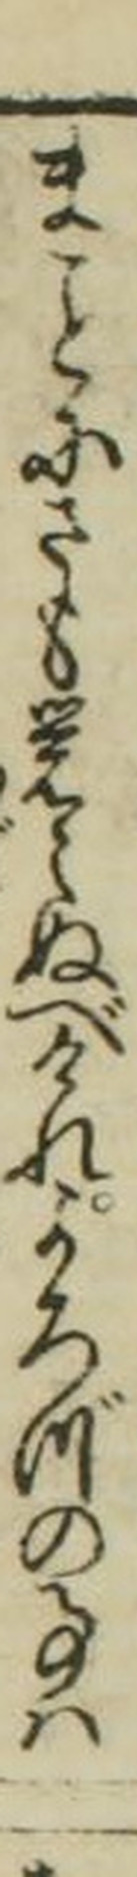まことにさも覚えぬべけれ。よろづの事は
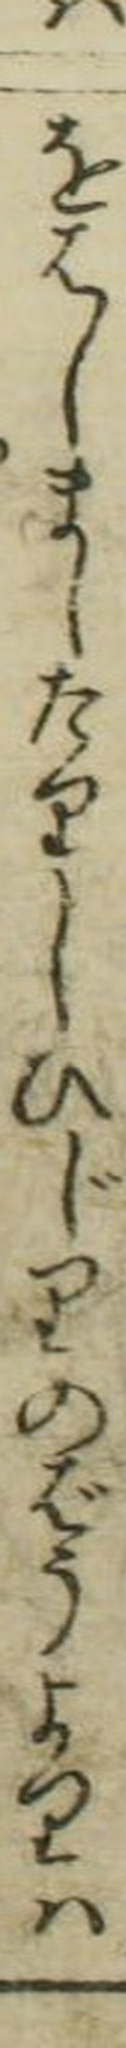をはしましたりしひじりのばうよりは。
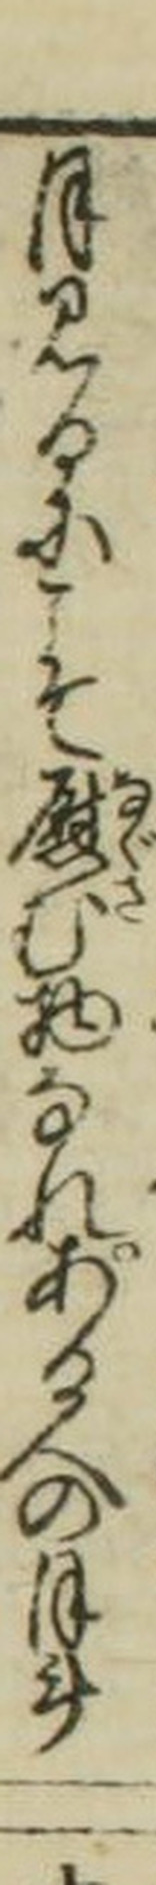月見るにこそ慰む物なれ。ある人の月計
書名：女源氏教訓鑑
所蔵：東京学芸大学附属図書館
